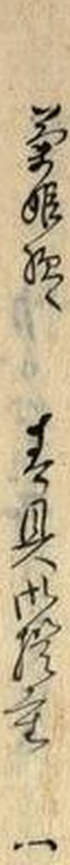菊姫様へ青貝御提重一
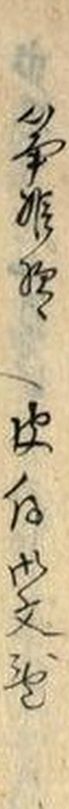箏姫様へ皮付御文台
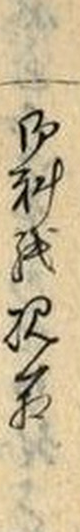御料紙硯箱
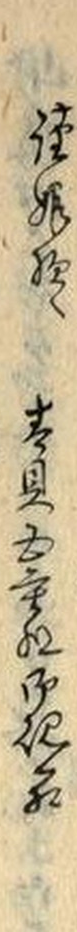謹姫様へ青貝五重組御硯箱
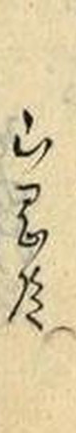山岡殿

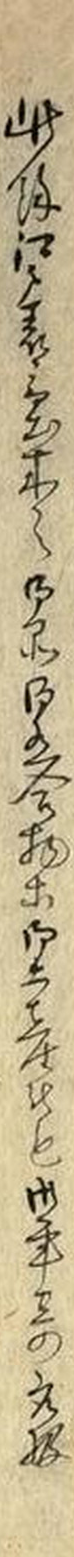此余江戸表ニ而出来之御品御有合物等御土産被進御年寄取扱
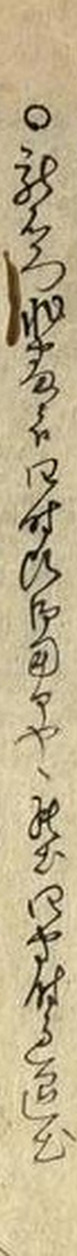〇新右衛門非番ニ而四時頃御用部ヤへ罷出四半時退出
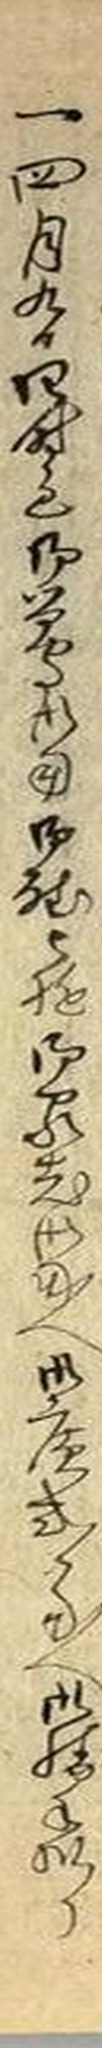一四月九日四時過御留守御用御聴被遊御家老御用人御広式両人御勝手掛り
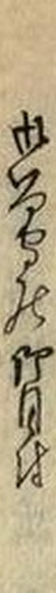御留守居御目付
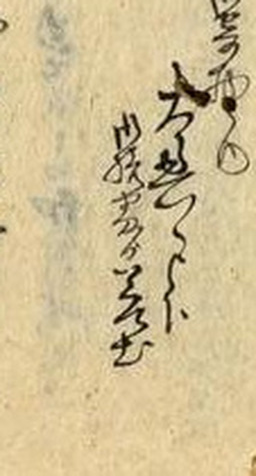御膳番ゟ差出
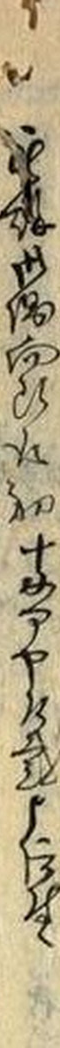此余御側向頭取初両部ヤ頂戴被仰付候
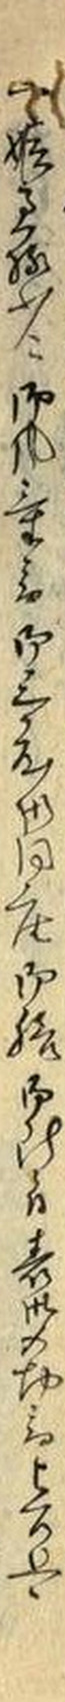一姫君様少々御風気ニ而御三度御同座御膳御断ニ付表御〆切ニ而被召上候
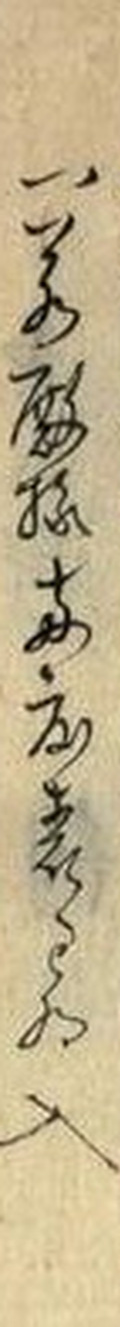一若殿様両度表へ被為入
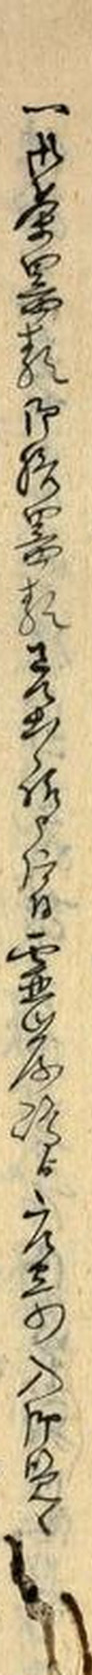一御茶器類御膳器類差出候様被仰付霊岸嶋ゟ取寄入御覧候
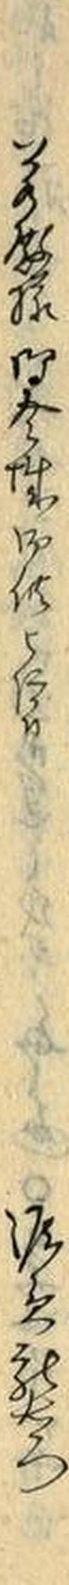若殿様御登城御供被仰付渥美新右衛門
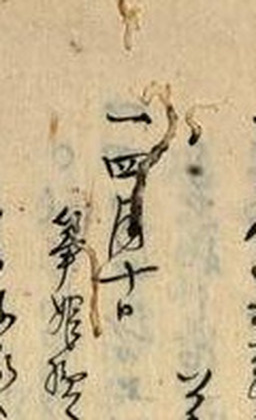一四月十日
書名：少傅日録抄（斉承付側向頭取日記、在府）
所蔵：福井県文書館 Fukui Prefectural Archives
